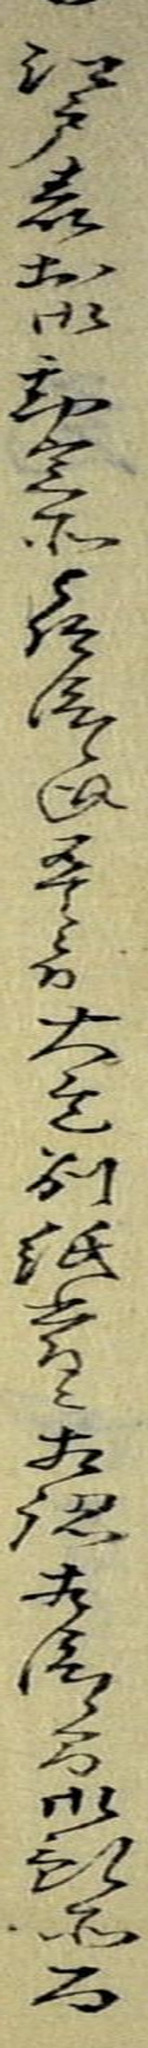〇江戸表於御勘定所被仰渡候趣有之候ニ付大意別紙書付ニ相認相渡候間御預所百
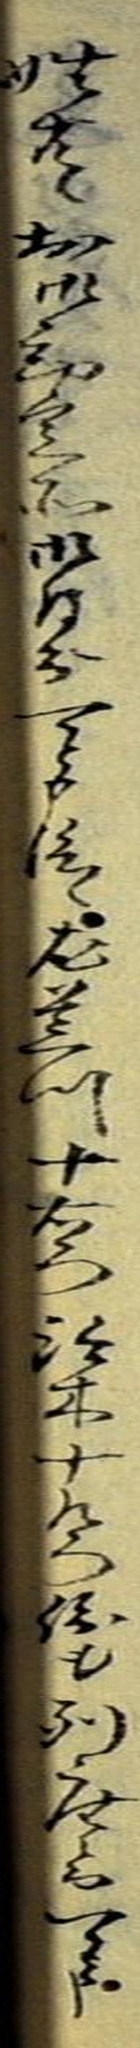姓共へ於御勘定所御自分可被申渡候尤荒川十右衛門鈴木十左衛門儀も列座ニ而可被申
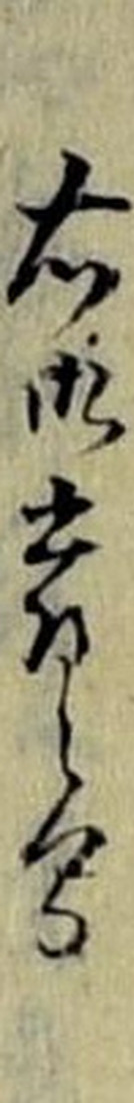右御書付之写
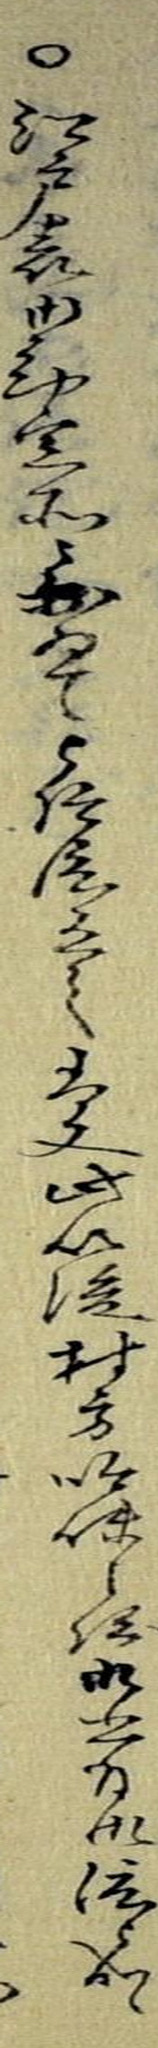〇江戸表御勘定所ニおゐて被仰渡有之尚又此以後村方吟味之儀御書付御渡被成候
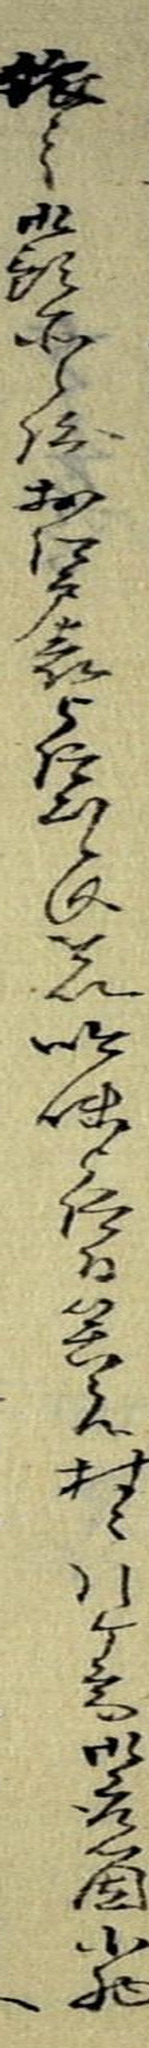依之御預所之儀於江戸表被仰出候趣を以吟味被仰付筈ニ候村々引ケ高御取箇小物
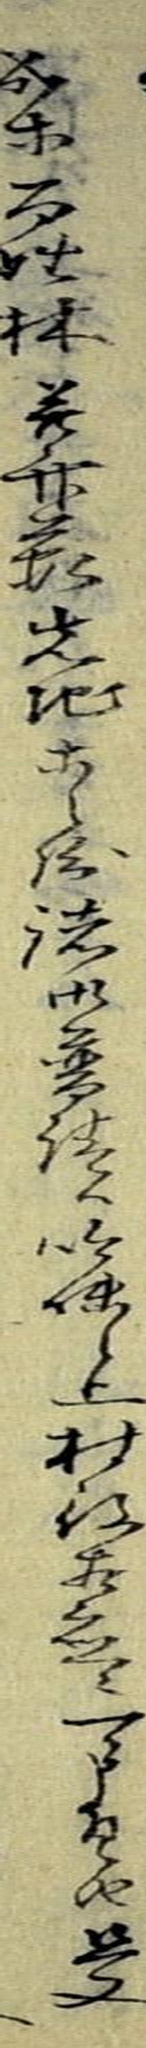成等百姓林并竹薮先地等之儀諸御普請ハ吟味之上村役相応ニ可申付候由且又
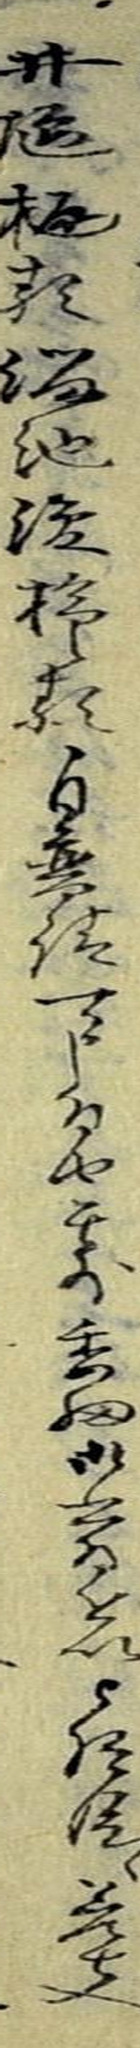井堰樋類溜池浚橋之類自普請可申付由其外委細御書付を以被仰渡候差支
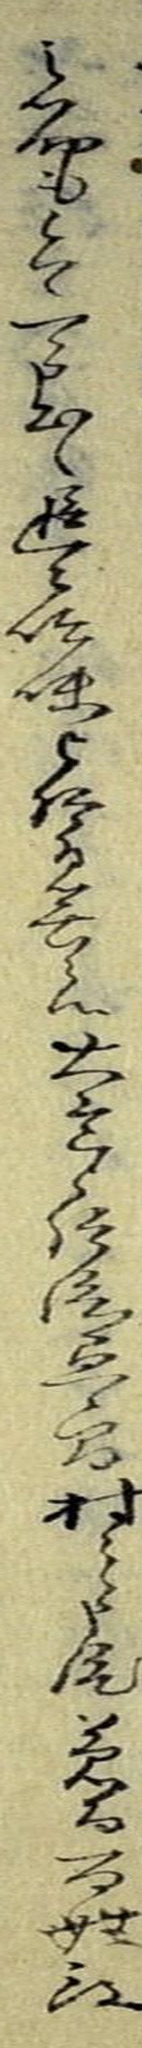之筋も候ハヽ可申出候追々吟味被仰付筈ニ候大意被仰渡置候間村々へ申渡兼而百姓致
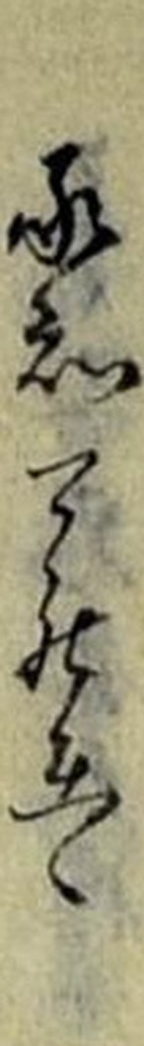承知可罷在候
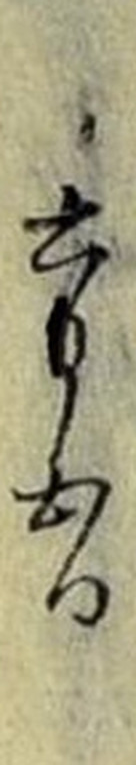六月五日
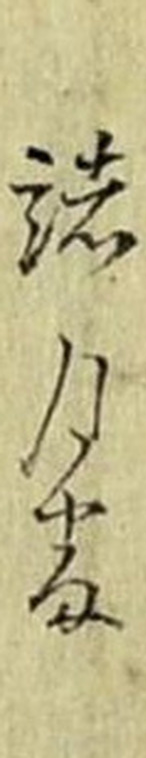諸月番
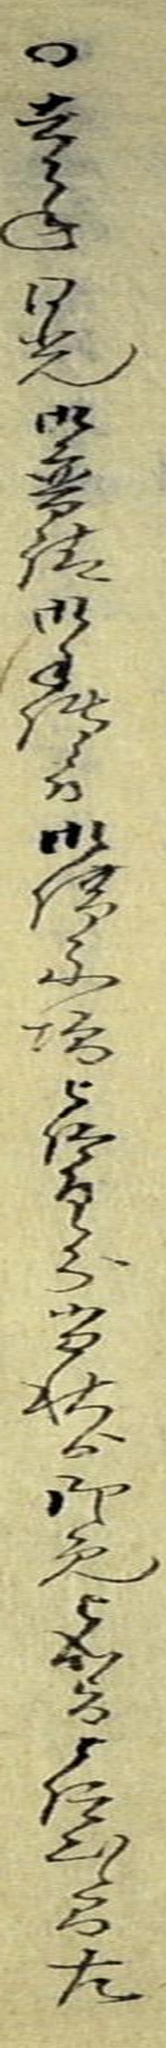〇去々年日光御普請御手伝ニ付御借米増被仰付候分当秋ゟ御免被成旨被仰出候間左
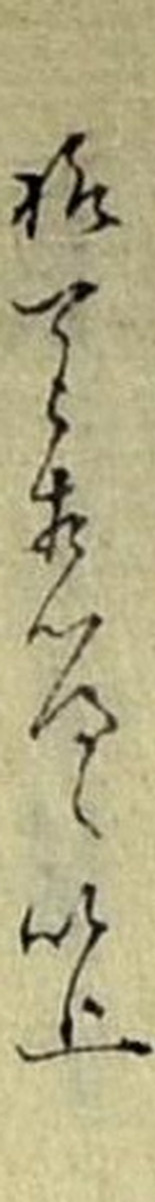様可被相心得候以上
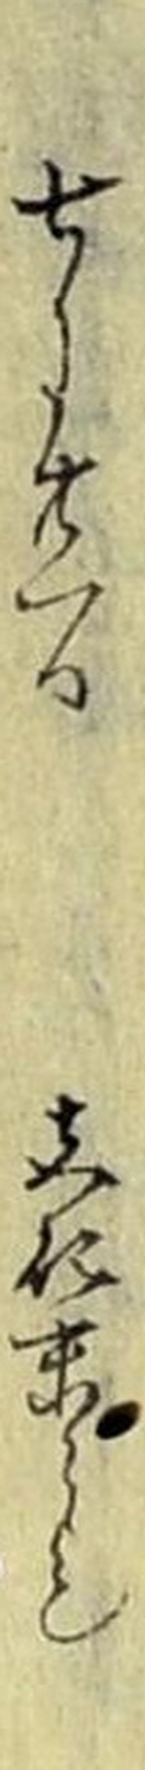七月廿一日支配末々迄
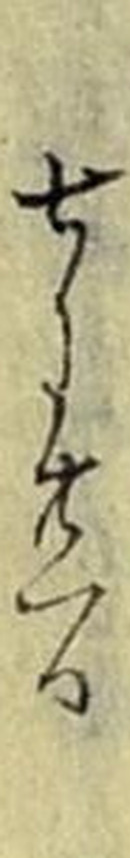三月廿一日
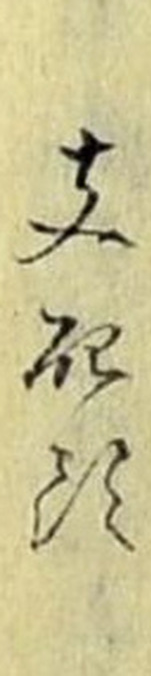支配頭
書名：命令之部 一
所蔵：福井県文書館 Fukui Prefectural Archives
